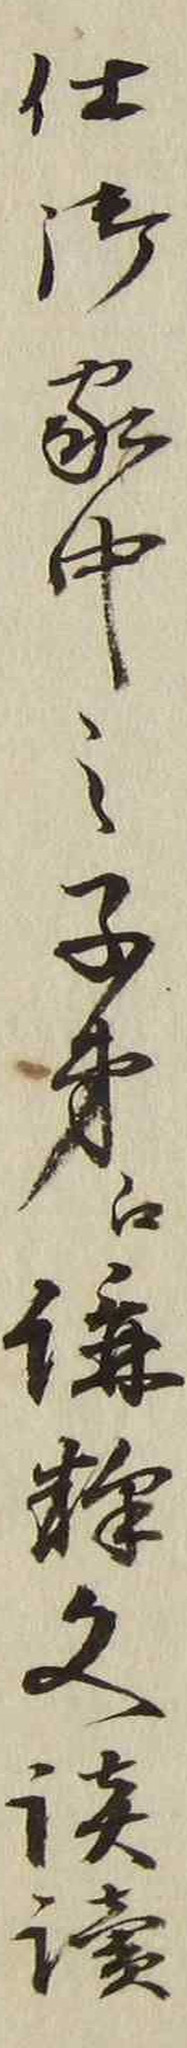仕御家中之子弟江講釈文談読

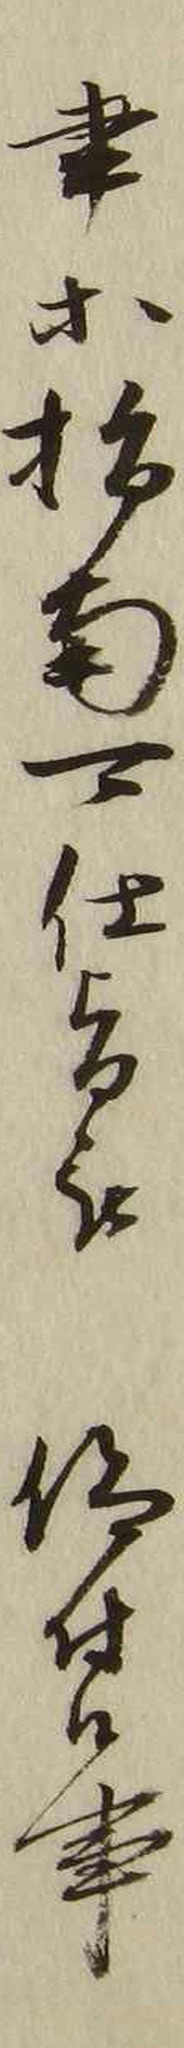書等指南可仕旨被仰付候事
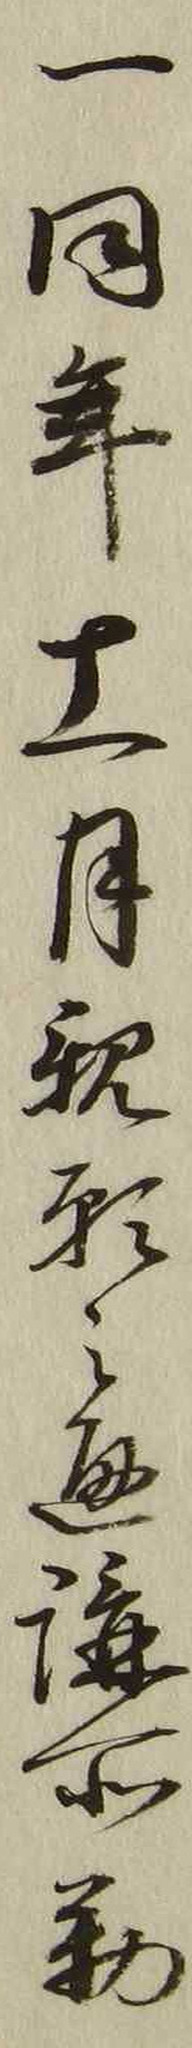一同年十一月親願之通講所勤
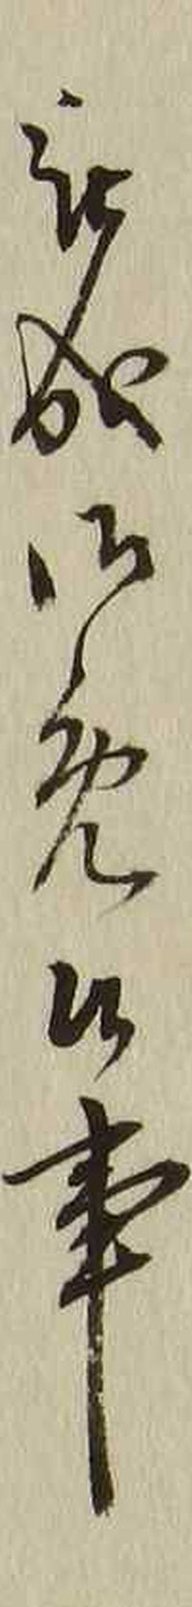被成御免候事
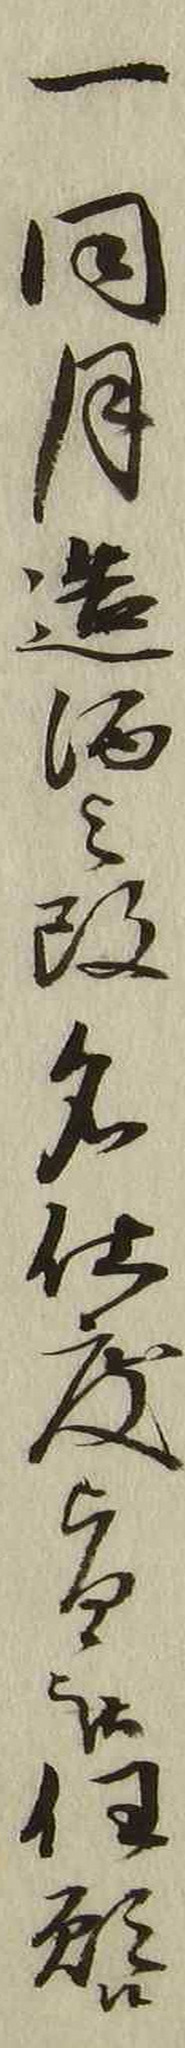一同月造酒与改名仕度旨被任願候
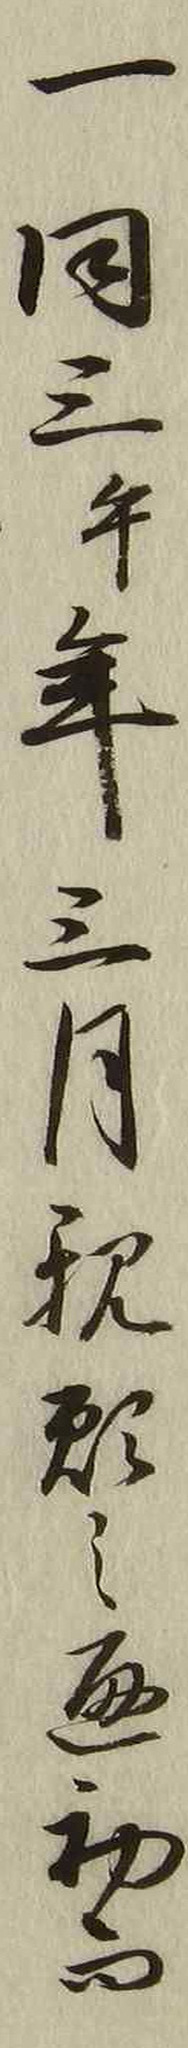一同三午年三月親願之通初而
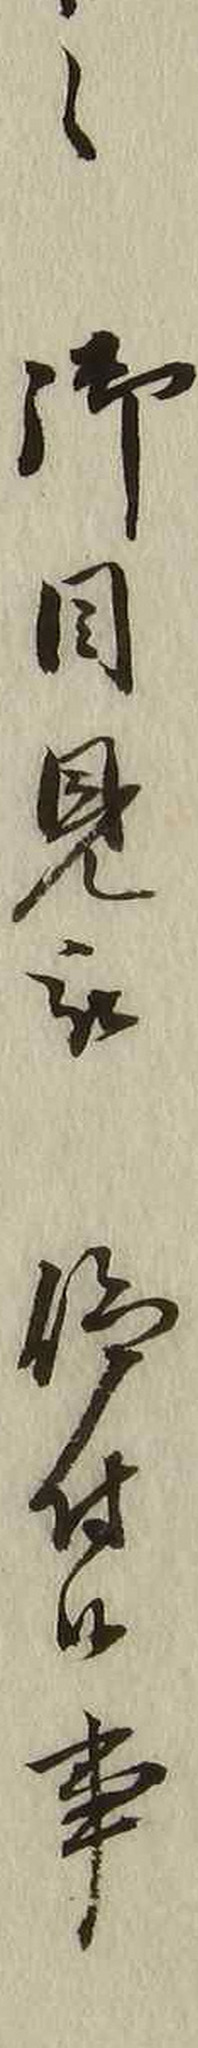之御目見被仰付候事
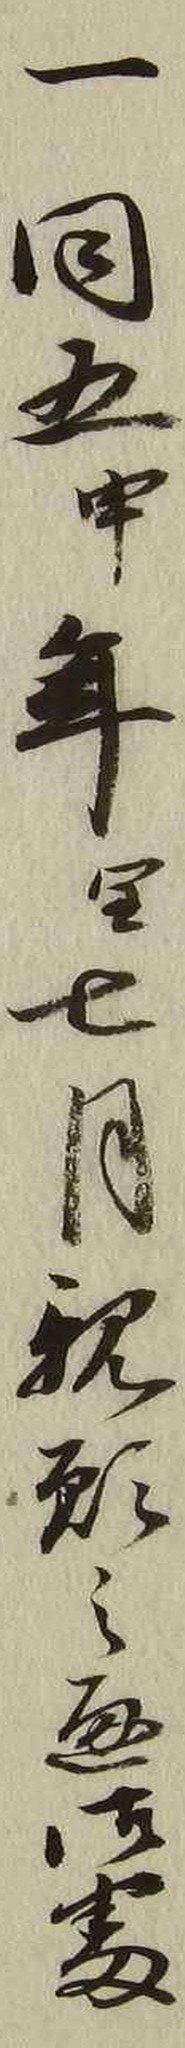一同五申年閏七月親願之通御番
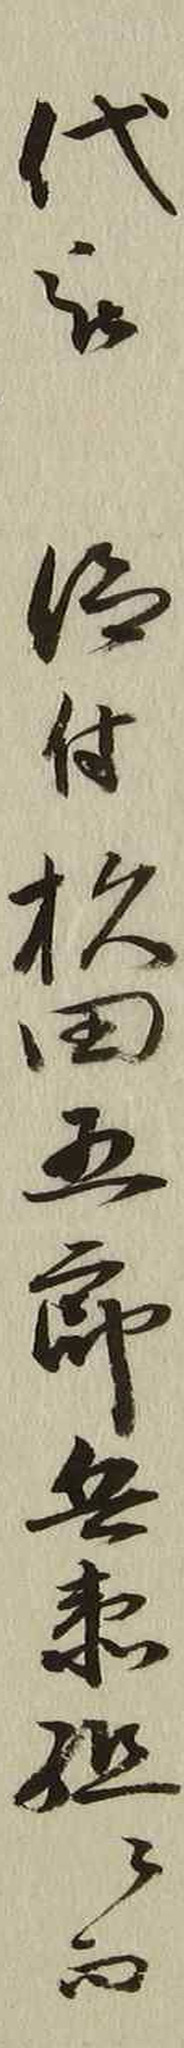代被仰付杉田五郎兵衛組ニ而
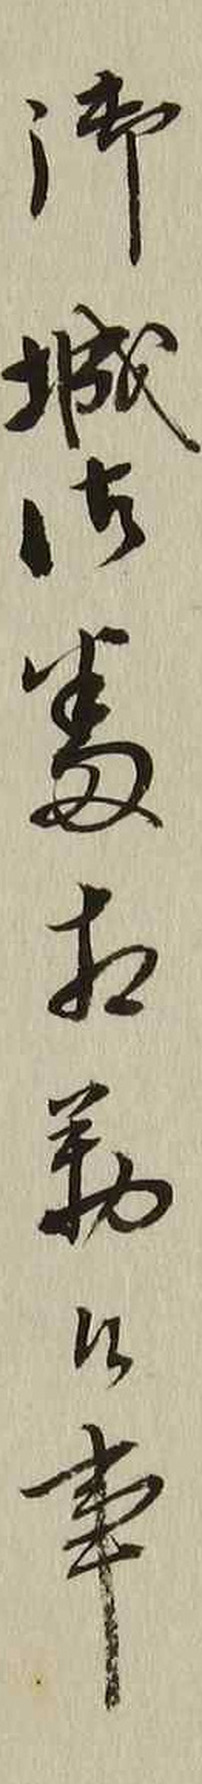御城御番相勤候事
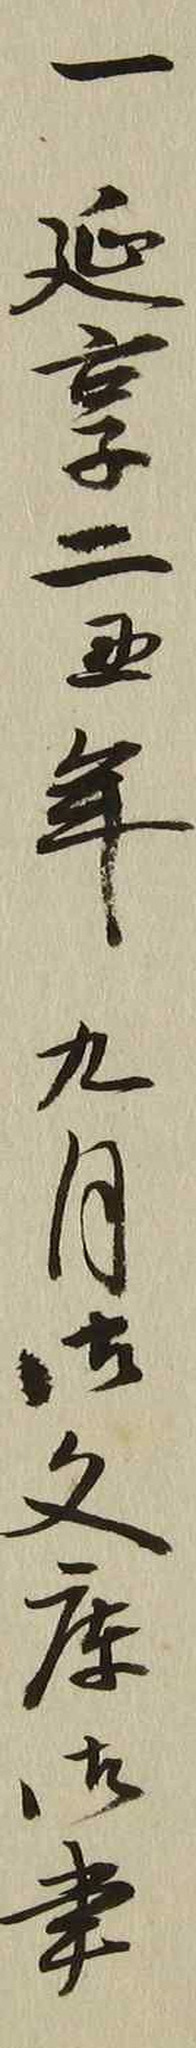一延享二丑年九月御文庫御書
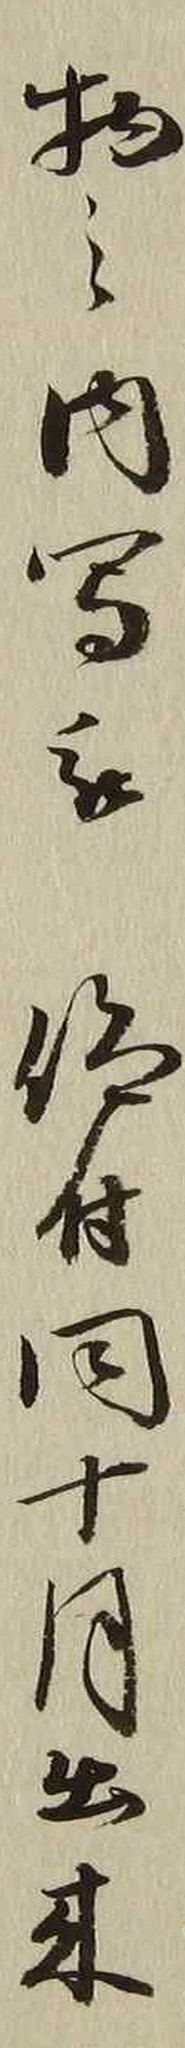物之内写被仰付同十月出来
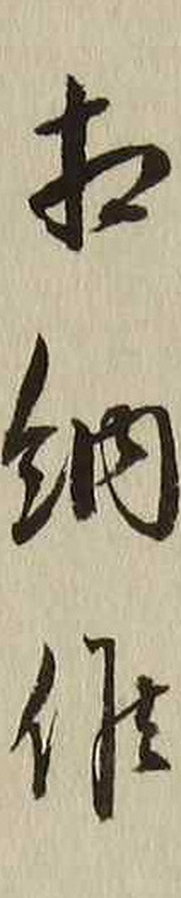相納候
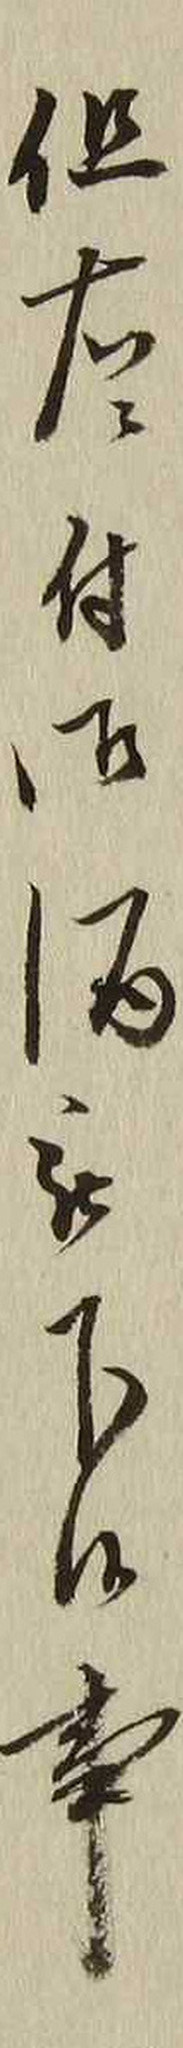但右ニ付御酒被下候事
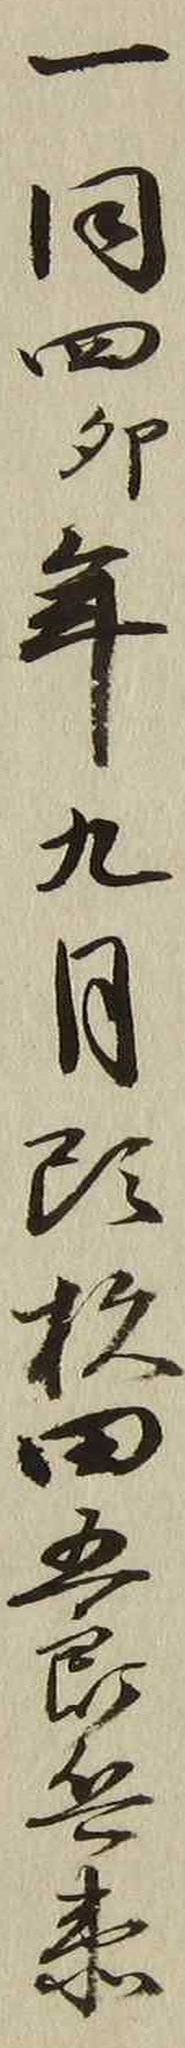一同四卯年九月頭杉田五郎兵衛
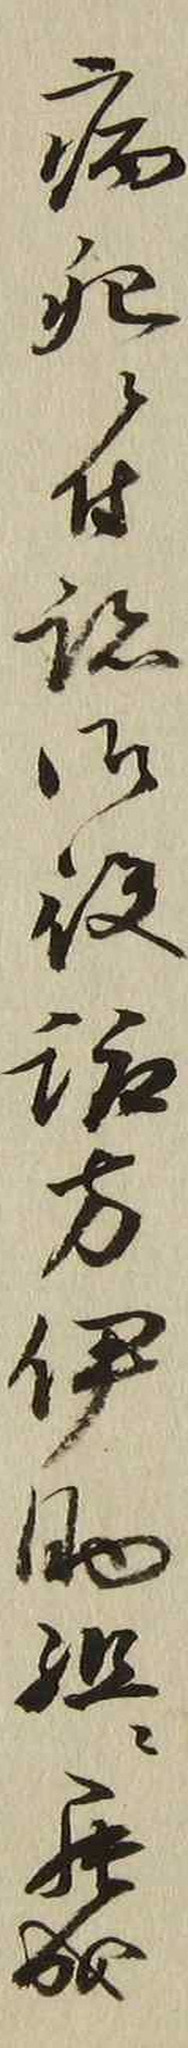病死ニ付跡御役諏方伊助組ニ罷成
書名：諸士系譜　巻之61　と之部4
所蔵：会津若松市立会津図書館
